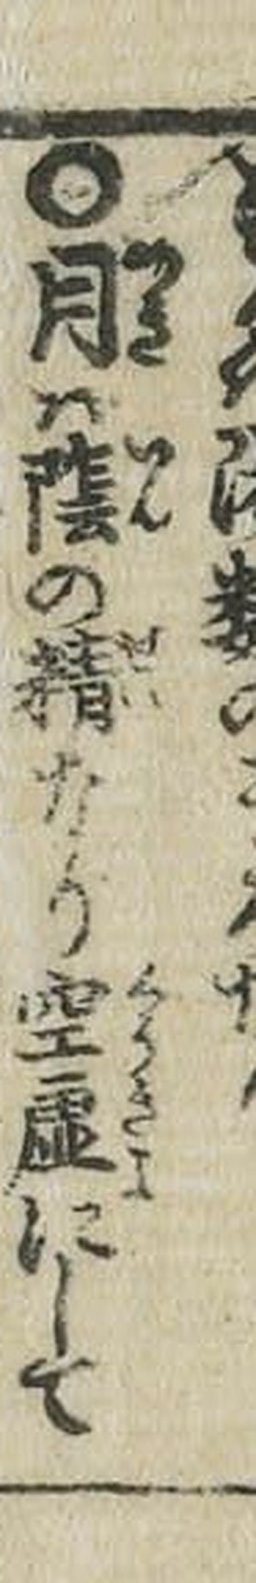○月は陰の精なり空虚にして
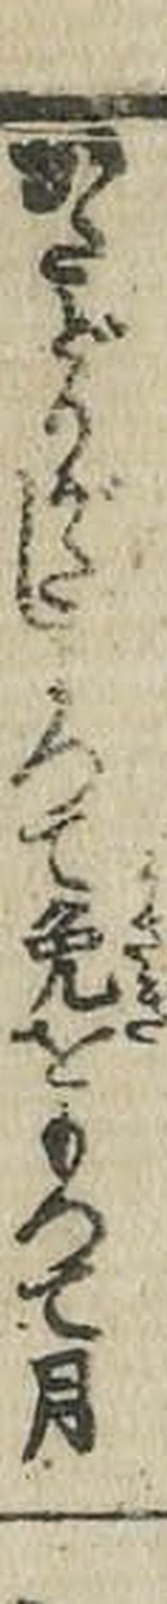かたどりがたしよつて兔をもつて月
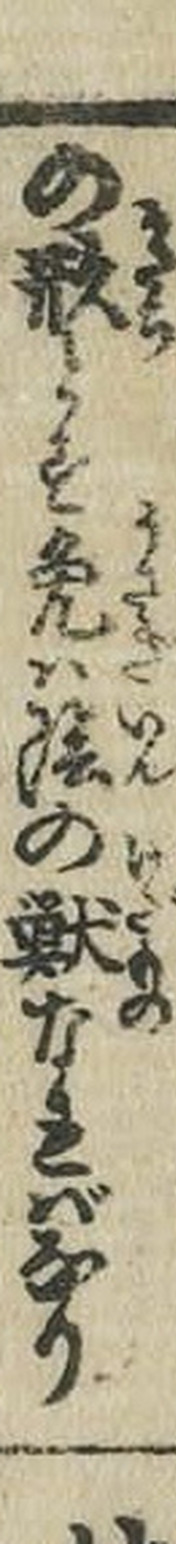の形とす兔は陰の獣なればなり
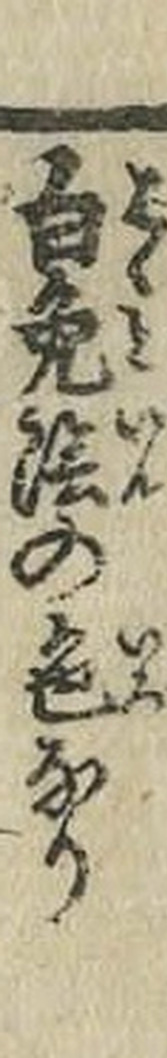白兔陰の色なり
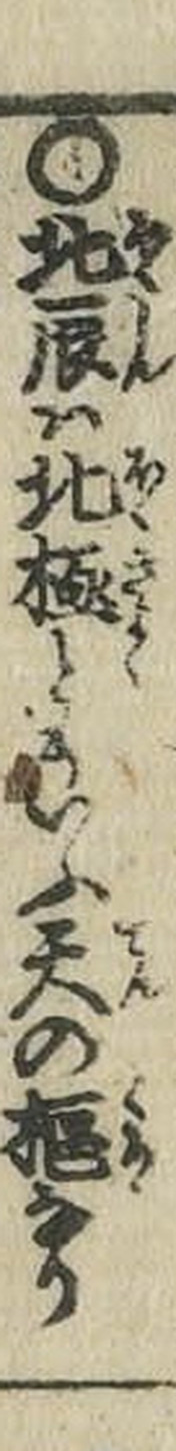○北辰は北極ともいふ天の枢なり
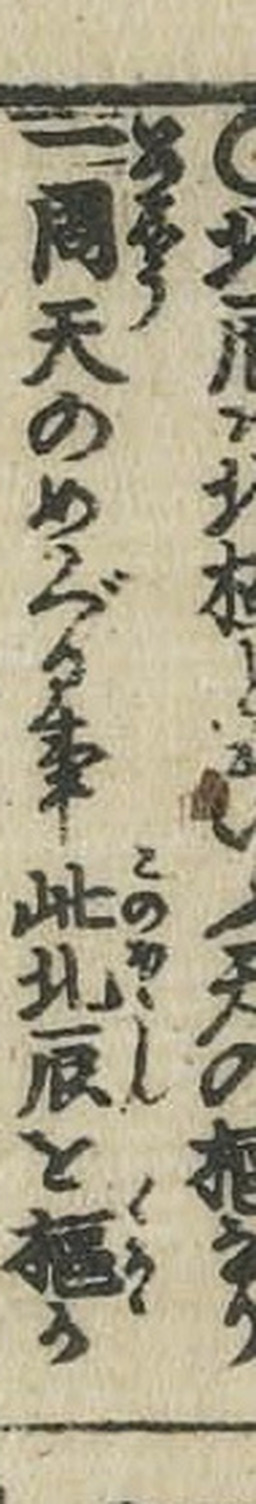一周天のめぐる事此北辰を枢か
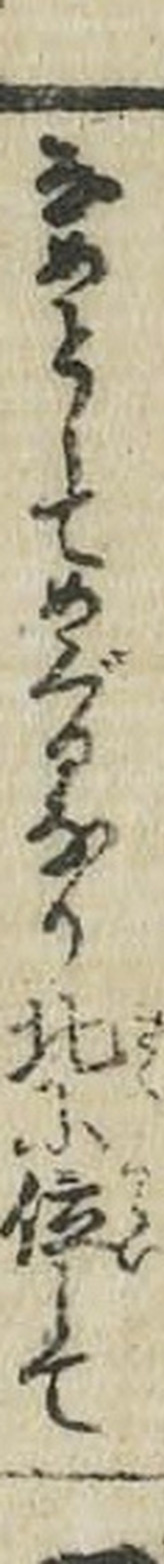なめとしてめぐるなり北に位して
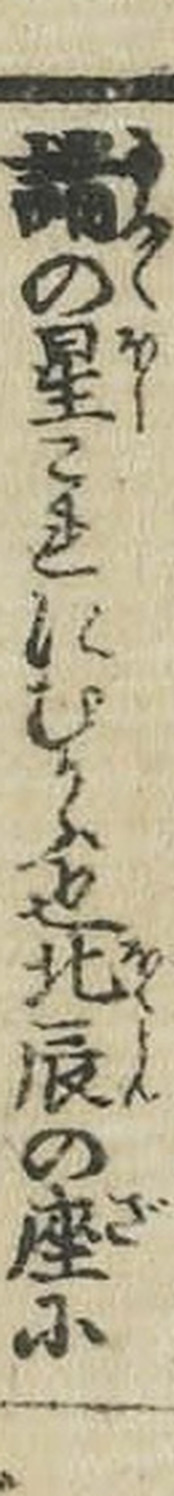諸の星これにむかふ也北辰の座に
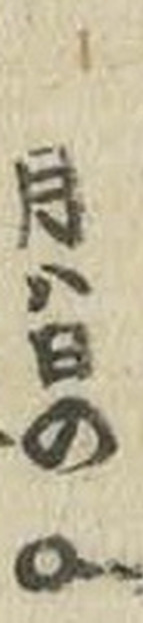月は日の
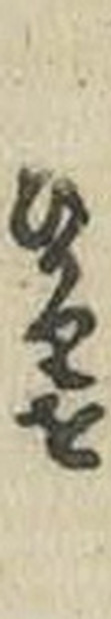ひかりを
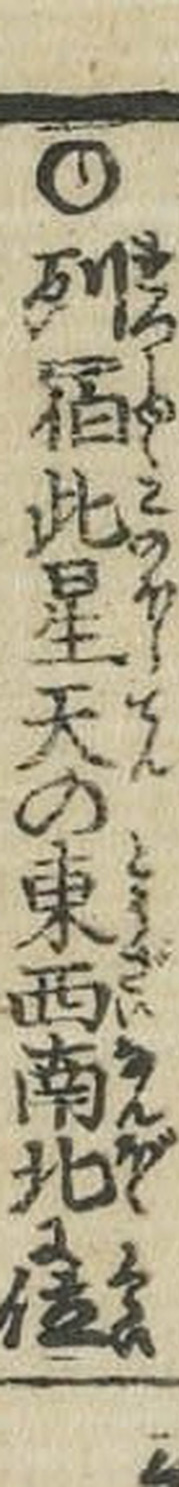○列宿此星天の東西南北に位
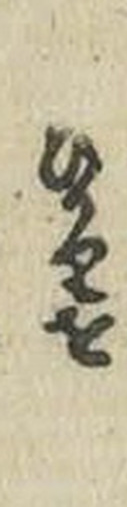ひかりを
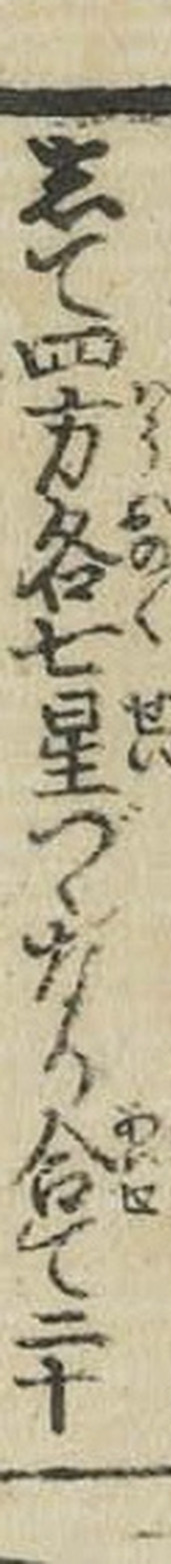して四方各七星づゝなり合て二十
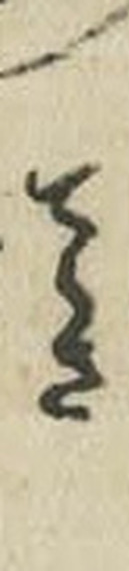てらさ
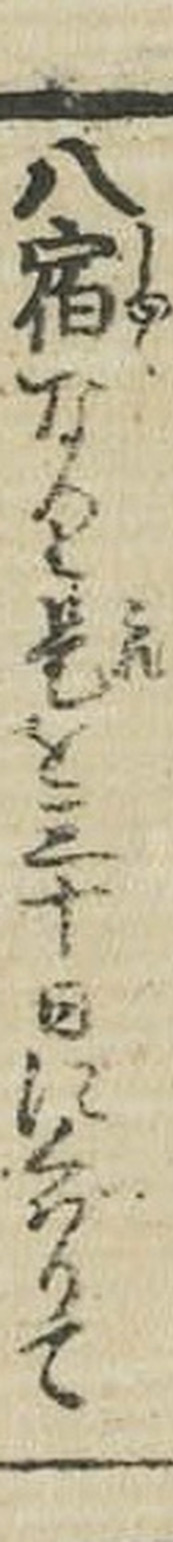八宿なり是を三十日にくばりて
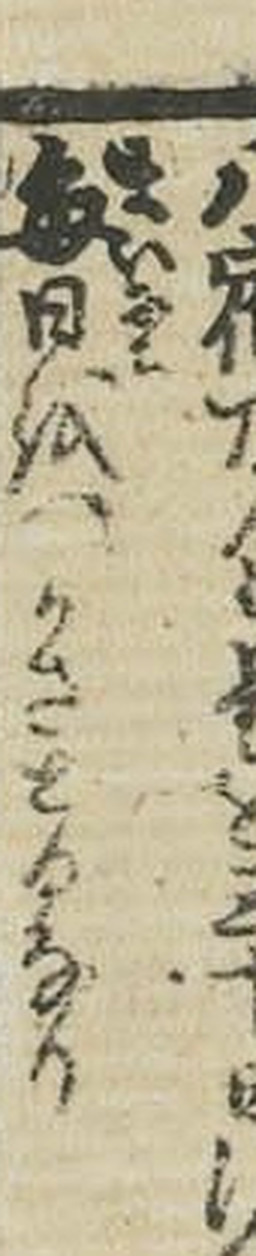毎日をつかさとるなり
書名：増補頭書訓蒙図彙大成 10巻 2:巻之1-3
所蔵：東京学芸大学教育コンテンツアーカイブ
